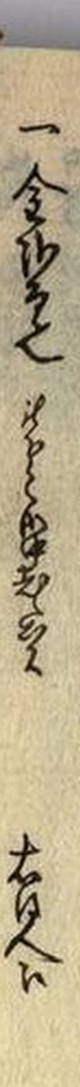一金弐百疋被下之御中老へ出ス右同人江
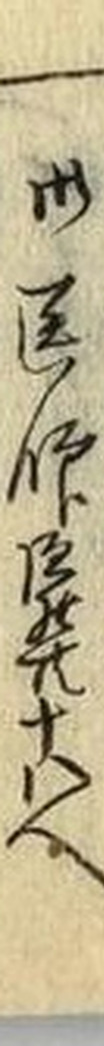御医師隠居共十八人
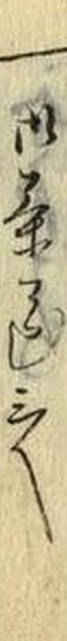御茶道三人
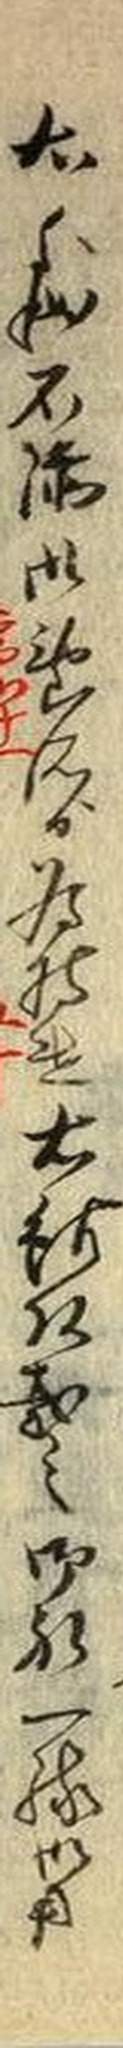右手紙不添御台所ゟ為持遣右鮎頂戴之御礼一統御用
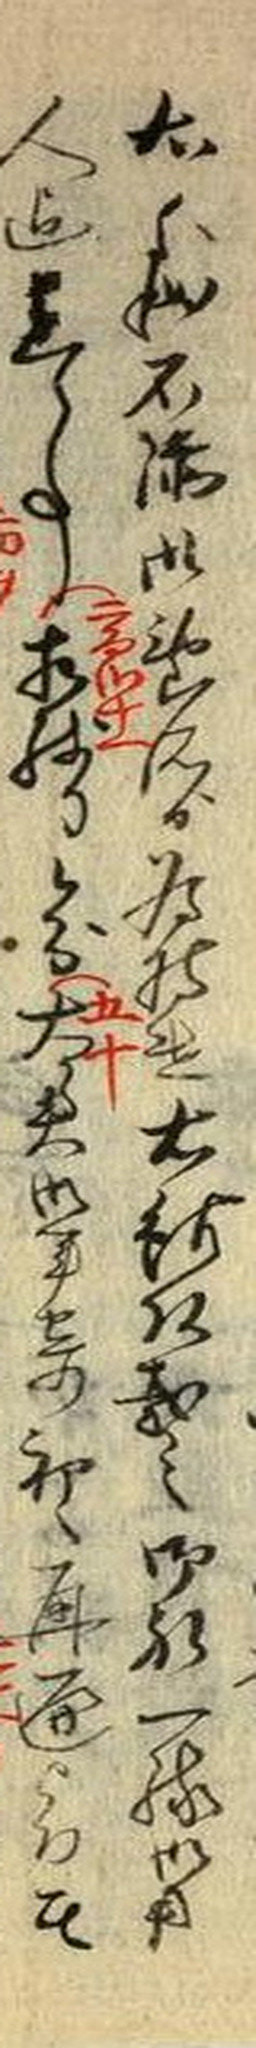人迄申上候事相残り候分大奥御年寄初へ再遍被下其
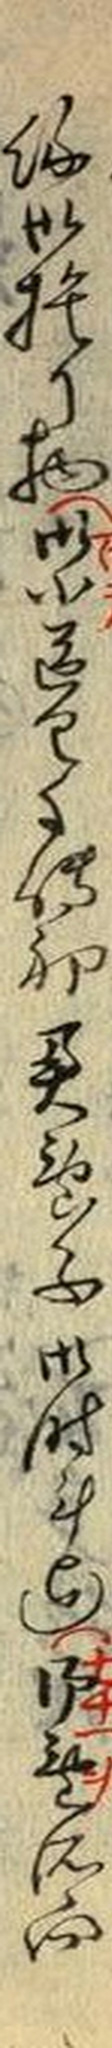余御捨り物御道具手伝初奥台子御時計迄御台所向
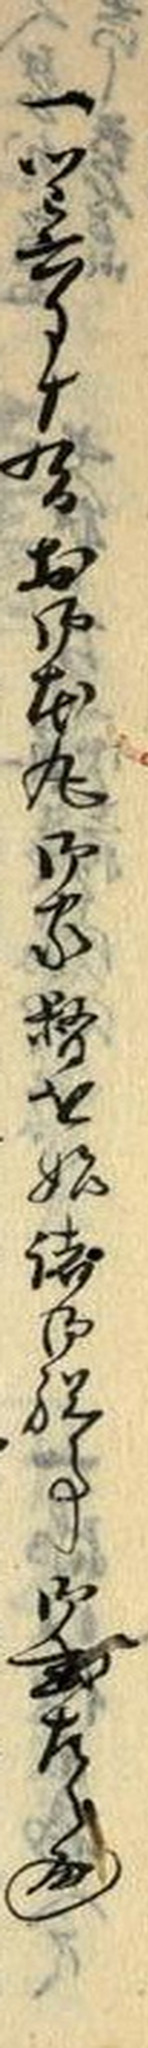一閏六月十九日於御本丸御家督を始諸御祝事御式左之通
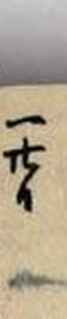一廿日
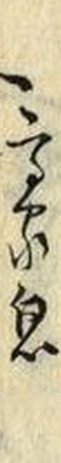高家息
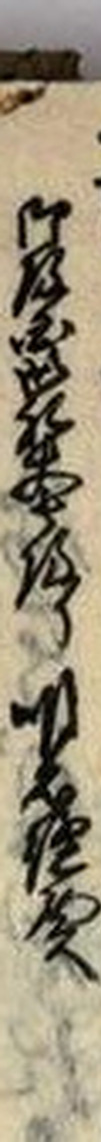御帰国御礼使者帰り明石縫殿
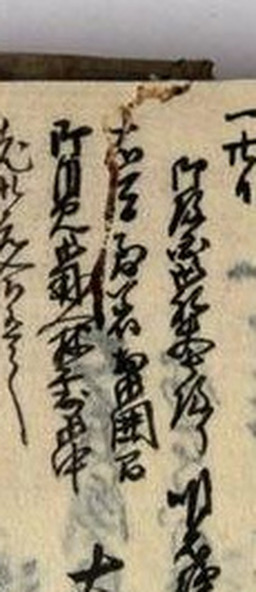右今日到着於御囲間
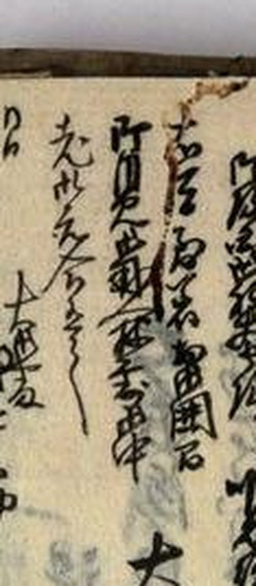御目見御用人披露御中
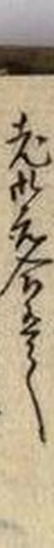老御取合有之
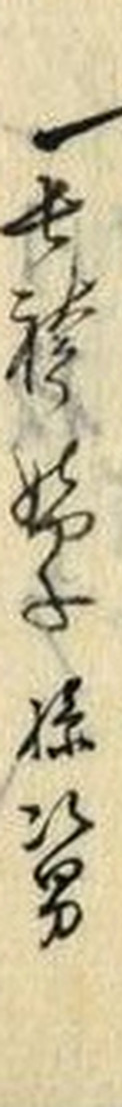長袴嫡子孫次男
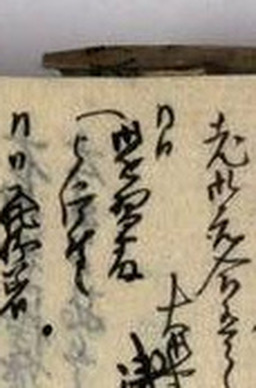御近習番
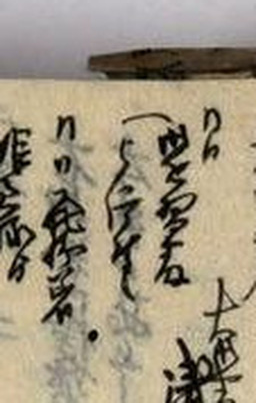被仰付候
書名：少傅日録抄（斉承付側向頭取日記、在国）
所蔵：福井県文書館 Fukui Prefectural Archives
